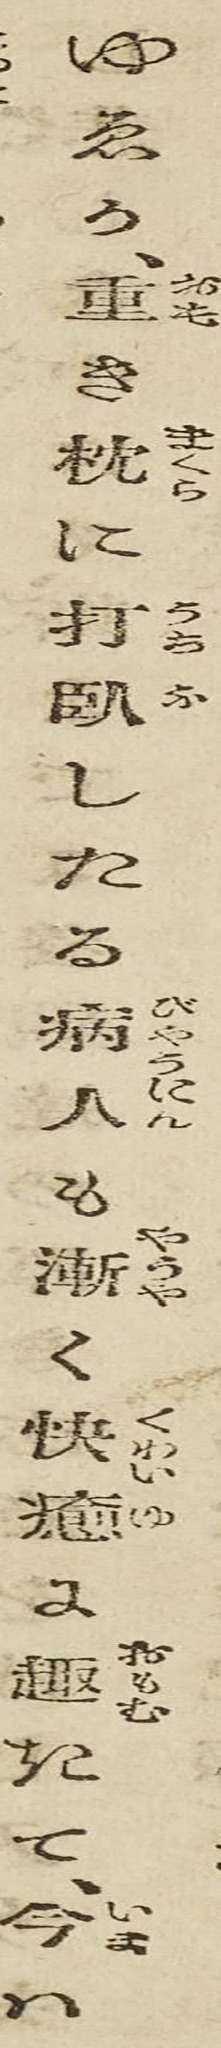ゆゑか、重き枕に打臥したる病人も漸く快癒に趣きて、今は
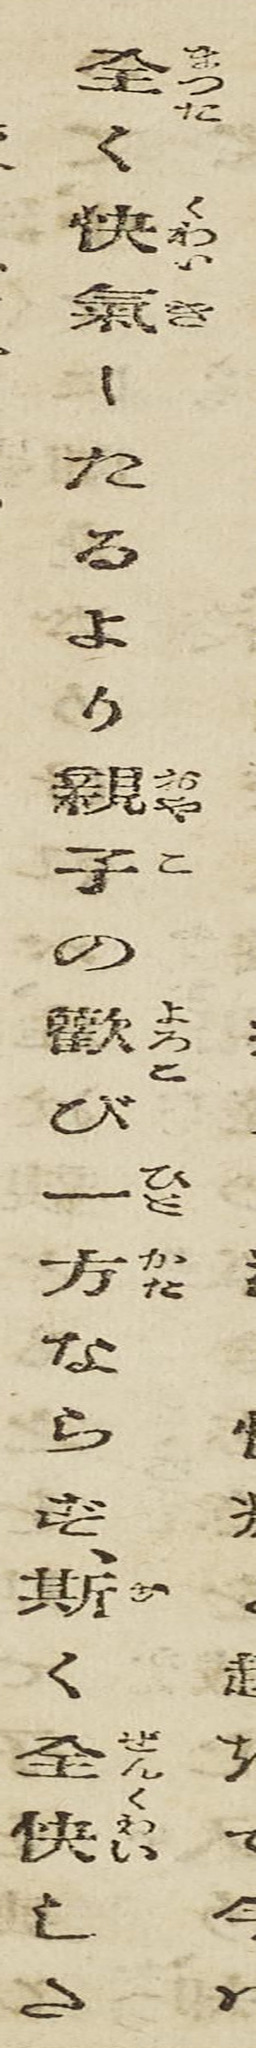全く快気したるより親子の歓び一方ならず、斯く全快した
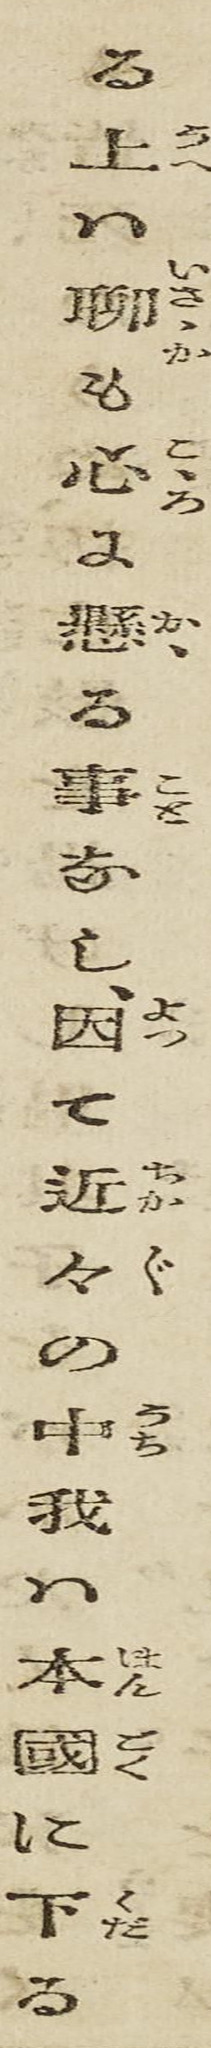る上は聊も心に懸る事なし、因て近々の中我は本国に下る
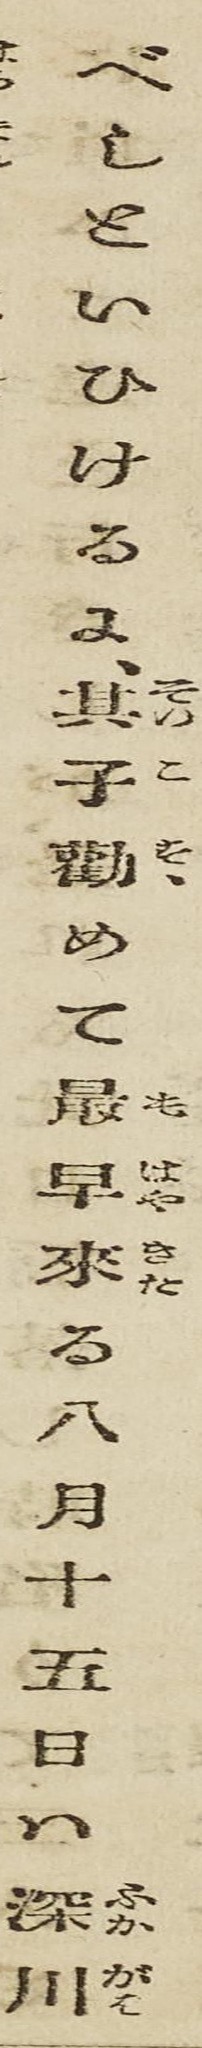べしといひけるに、其子勧めて最早来る八月十五日は深川
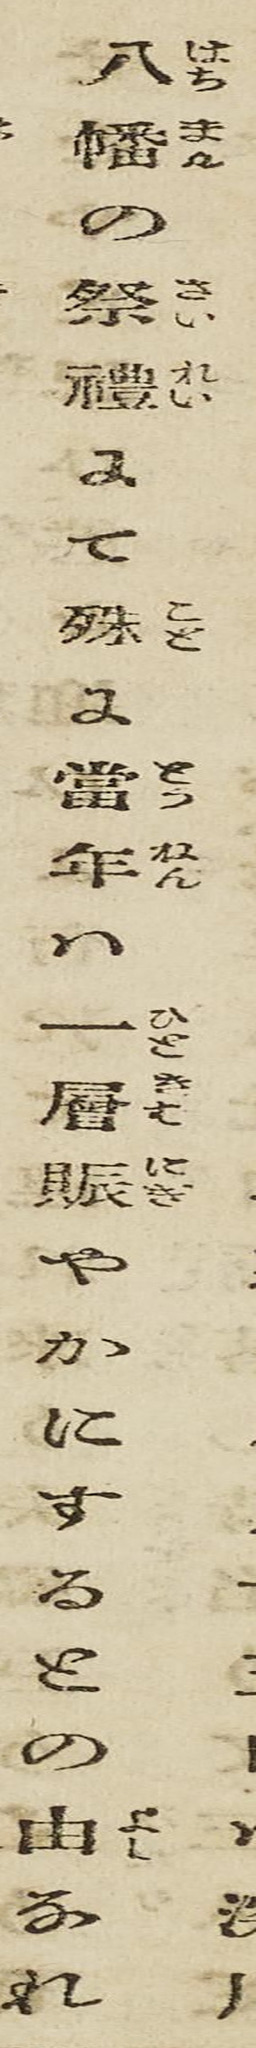八幡の祭礼にて殊に当年は一層賑やかにするとの由なれ
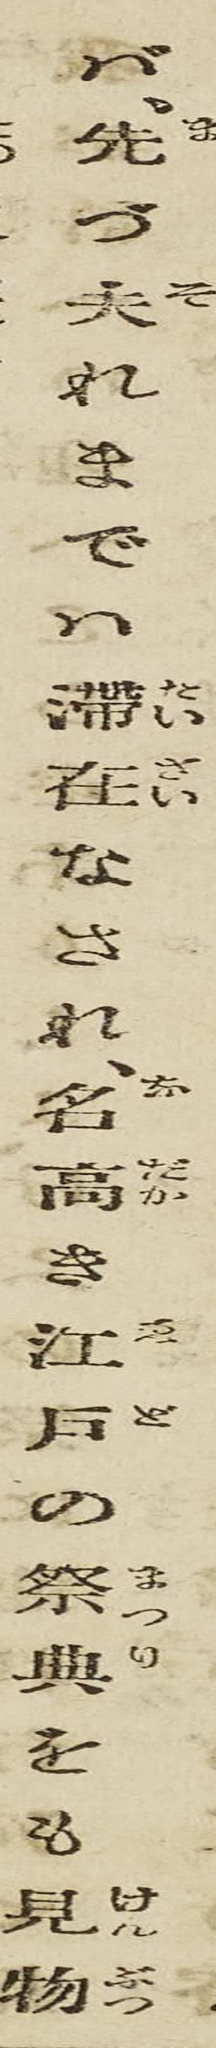ば、先づ夫れまでは滞在なされ名高き江戸の祭典をも見物
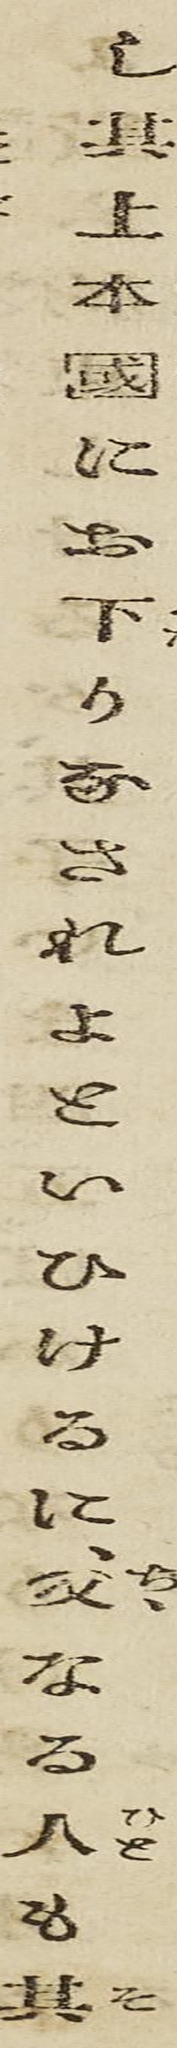し其上本国にお下りなされよといひけるに、父なる人も其
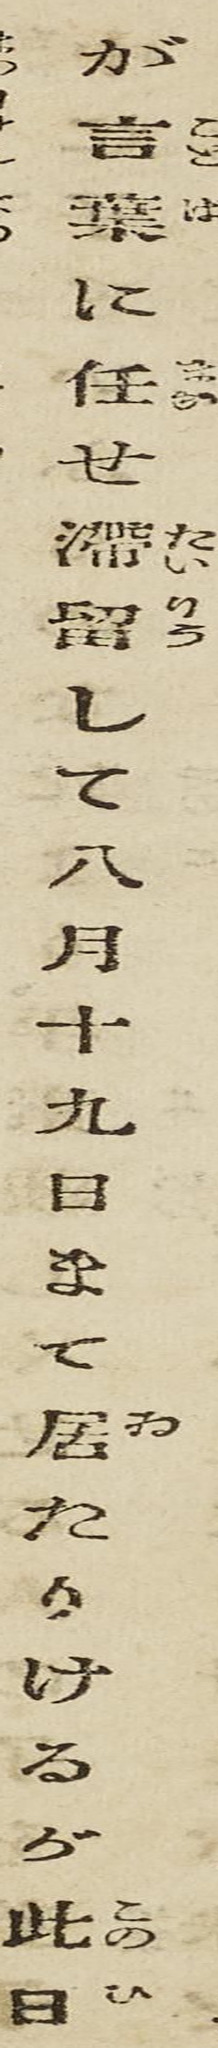が言葉に任せ滞留して八月十九日まて居たりけるが此日
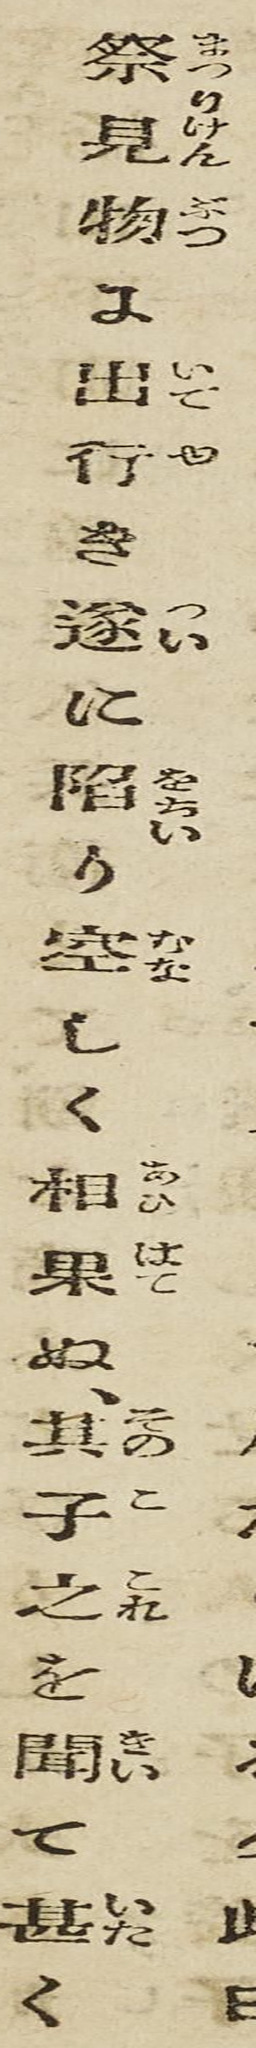祭見物に出行き遂に陥り空しく相果ぬ、其子之を聞て甚く
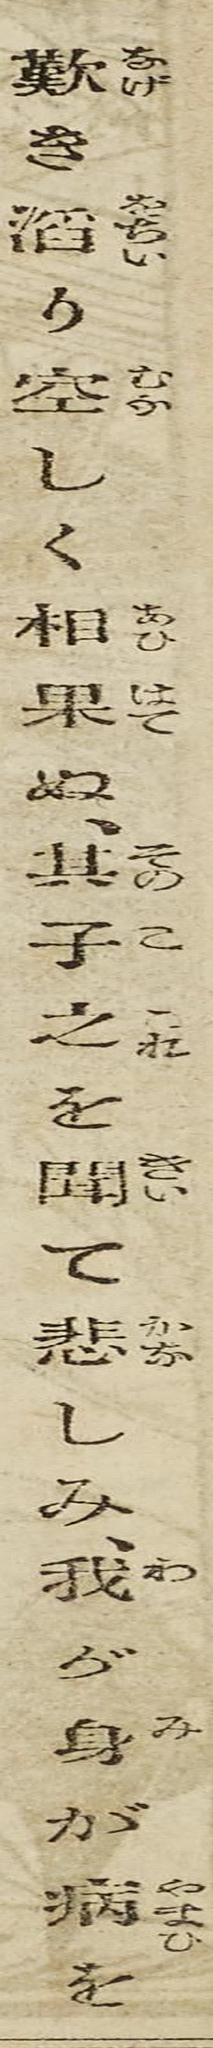歎き滔り空しく相果ぬ、其子之を聞て悲しみ、我が身が病を
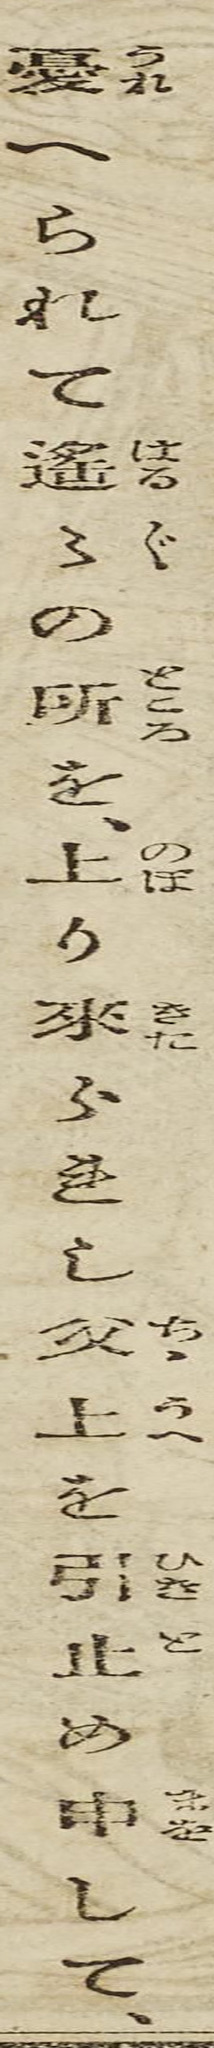憂へられて遥〻の所を、上り来られし父上を引止め申して、
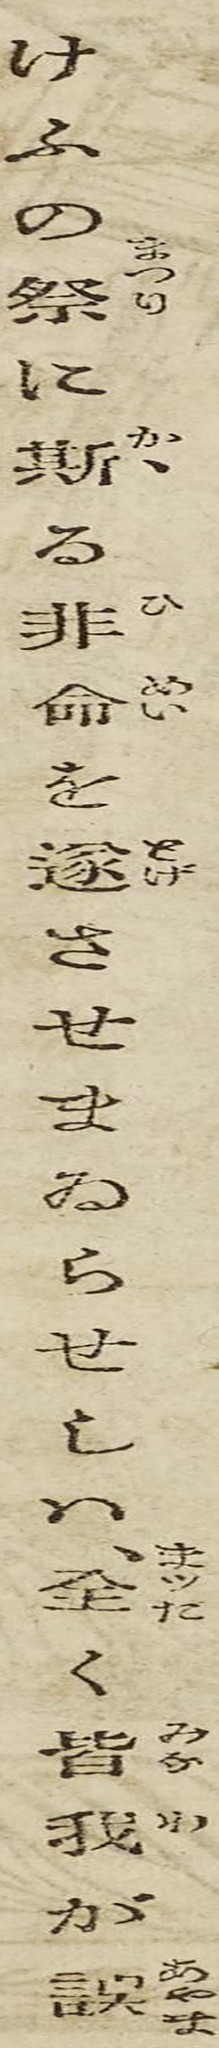けふの祭に斯る非命を遂させまゐらせしは、全く皆我が誤
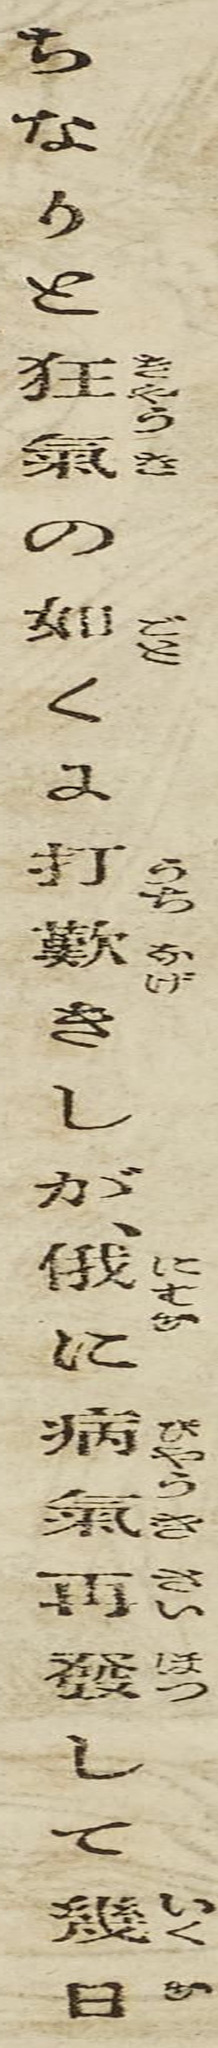ちなりと狂気の如くに打歎きしが、俄に病気再発して幾日
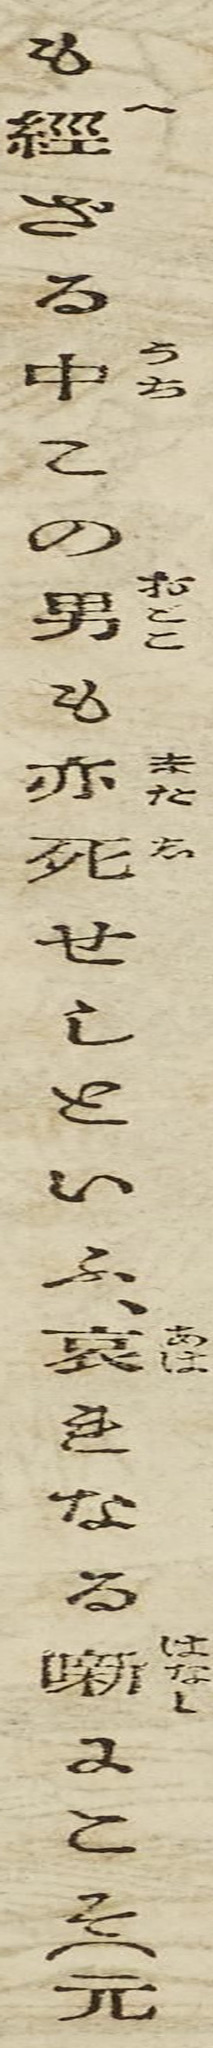も経ざる中この男も亦死せしといふ、哀れなる噺にこそ（元
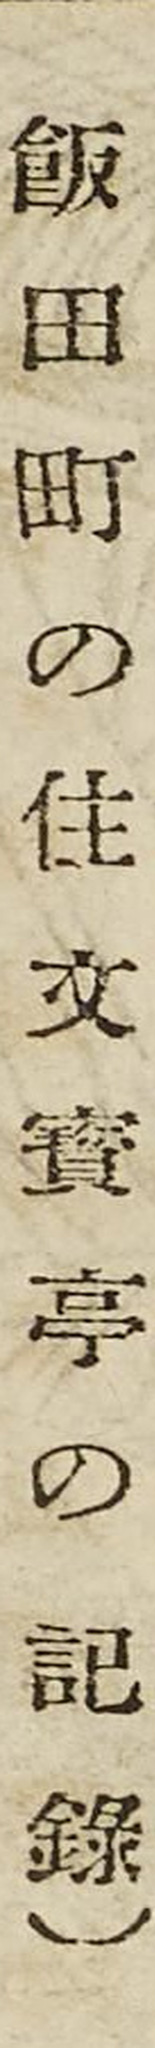飯田町の住文實亭の記録）
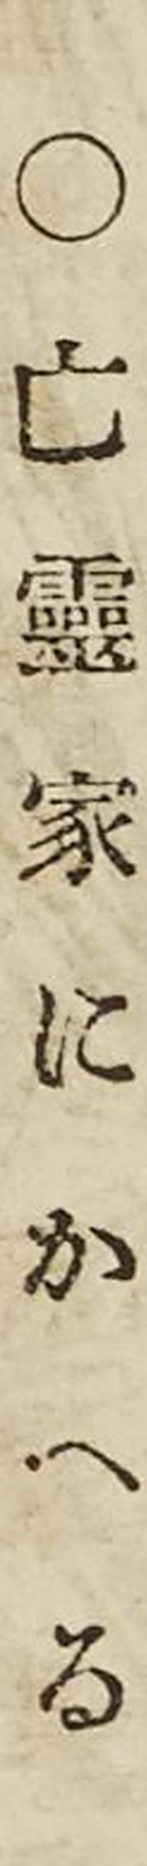○亡霊家にかへる
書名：永代惨話　文化の夢　全
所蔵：東京大学地震研究所図書室 Earthquake Research Institute Library, The University of Tokyo, JAPAN
